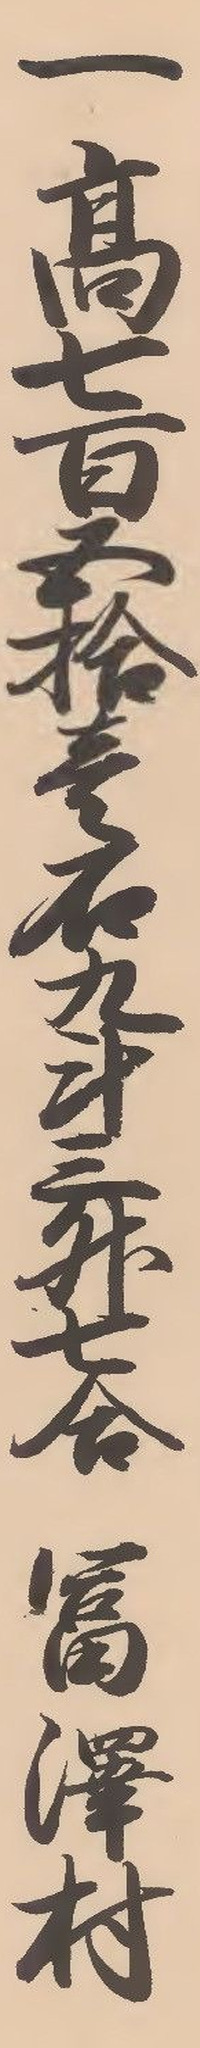一高七百五拾壱石九斗三升七合冨沢村
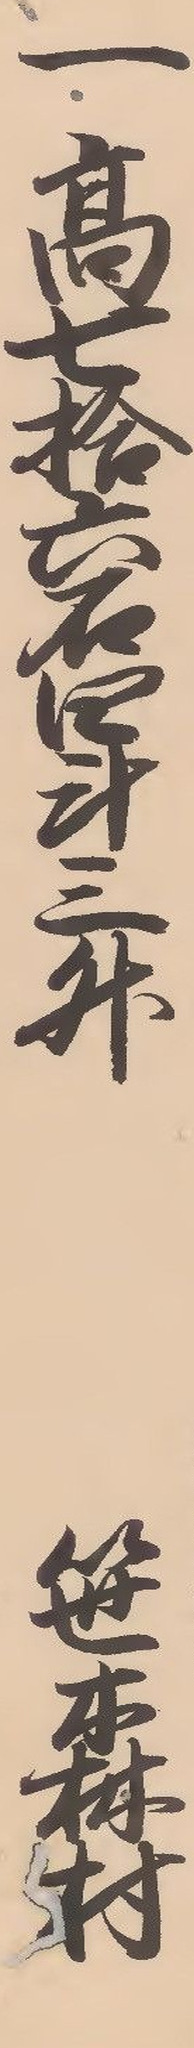一高七拾六石四斗三升笹森村

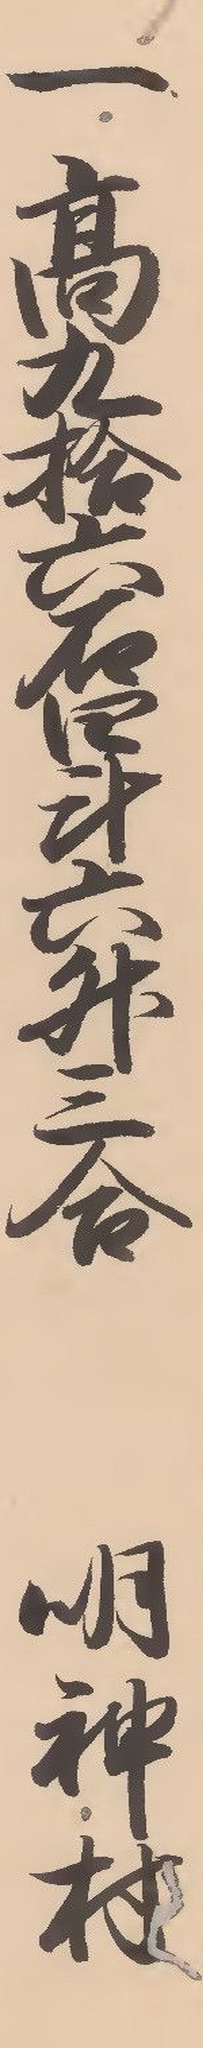一高九拾六石四斗六升三合明神村
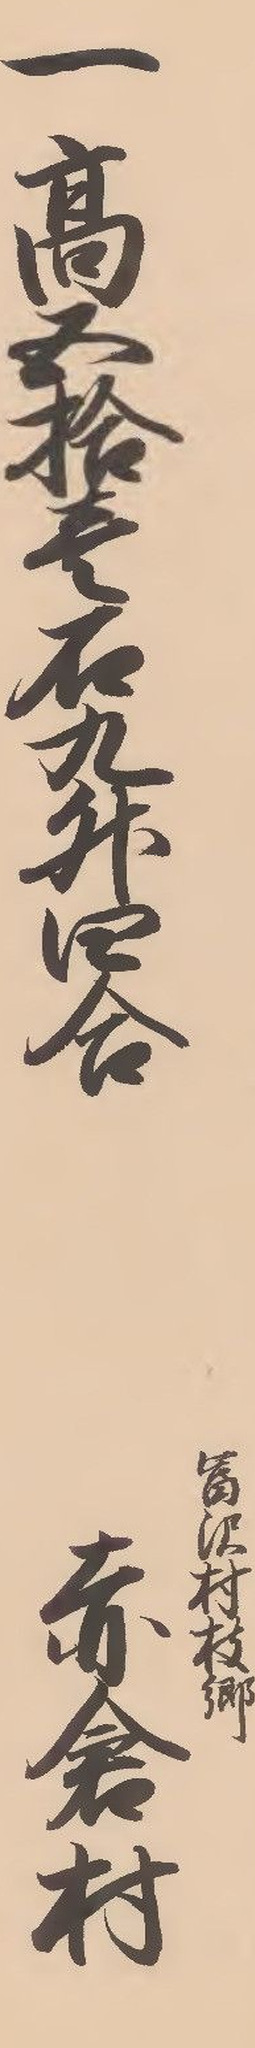一高五拾壱石九升四合赤倉村
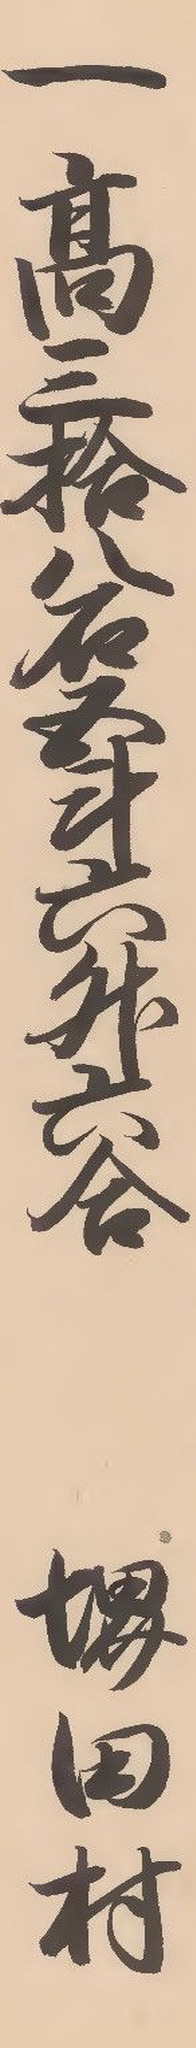一高三拾八石五斗六升六合堺田村
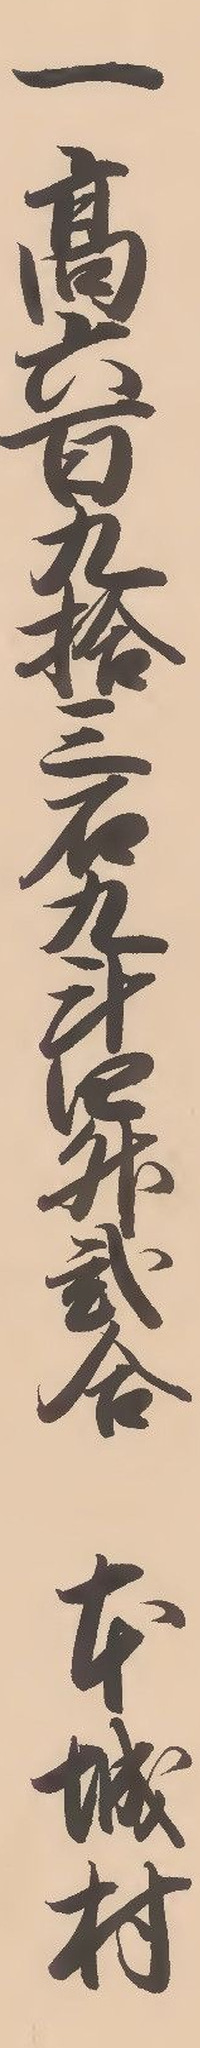一高六百九拾三石九斗四升弐合本城村
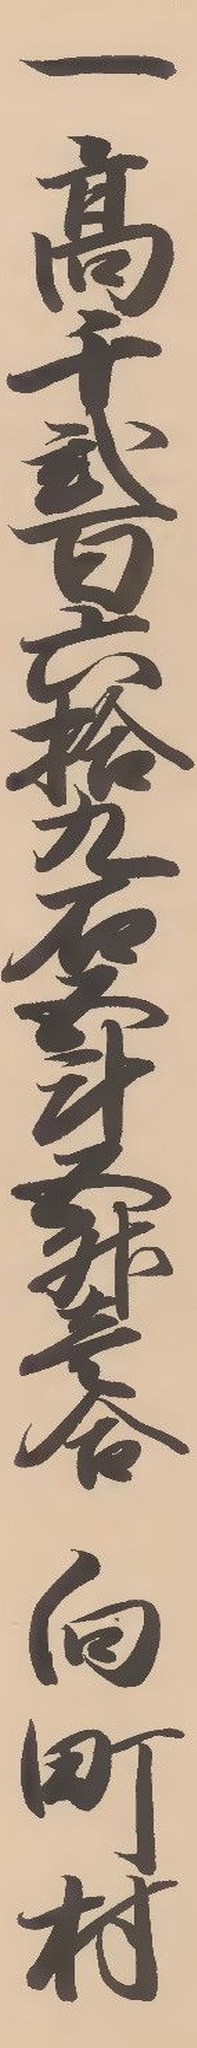一高千弐百六拾九石五斗五升壱合向町村
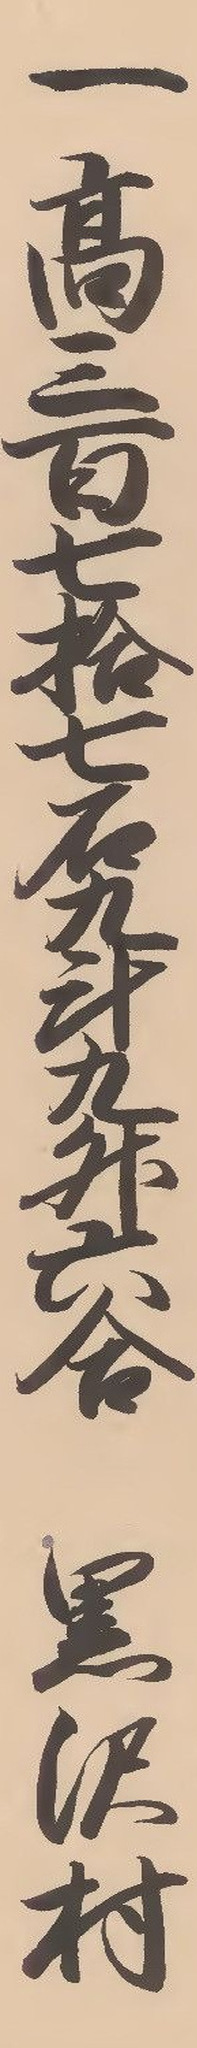一高三百七拾七石九斗九升六合黒沢村
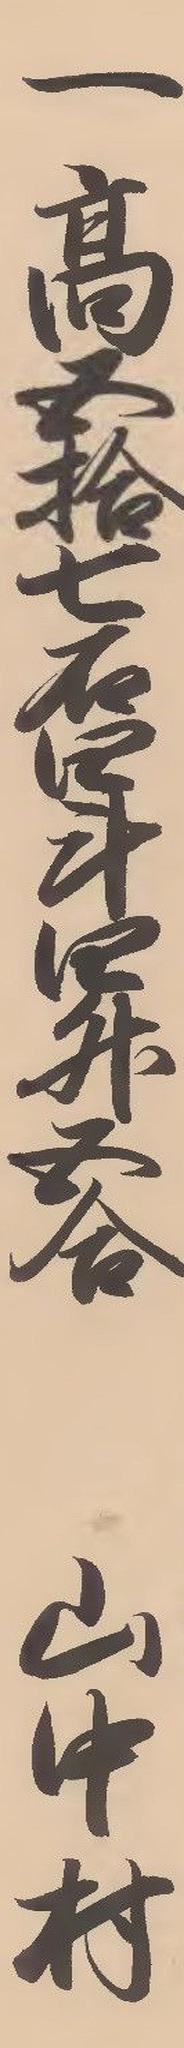一高五拾七石四斗四升五合山中村
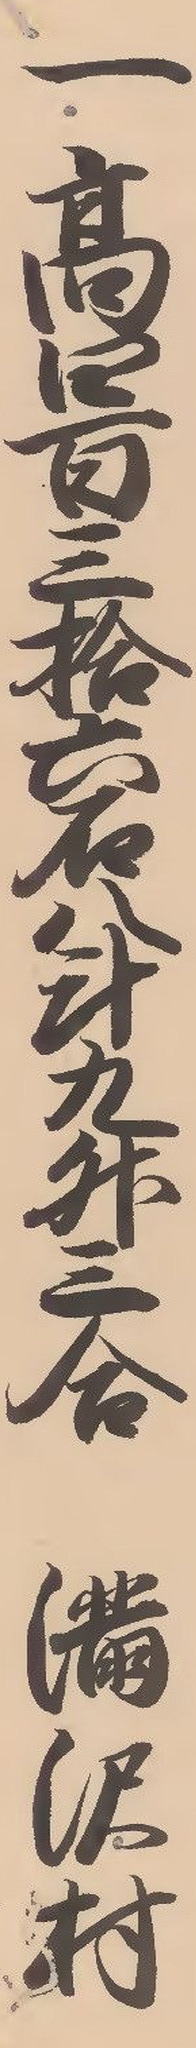一高四百三拾六石八斗九升三合満沢村

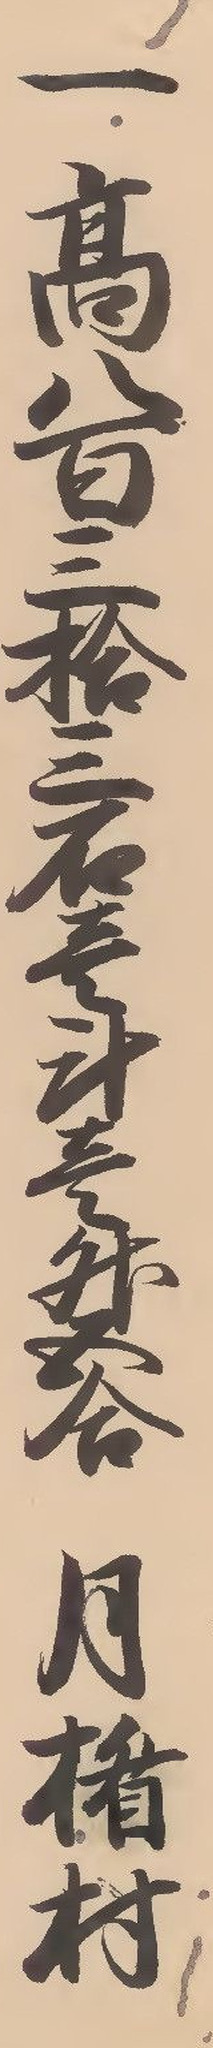一高八百三拾三石壱斗壱升五合月楯村
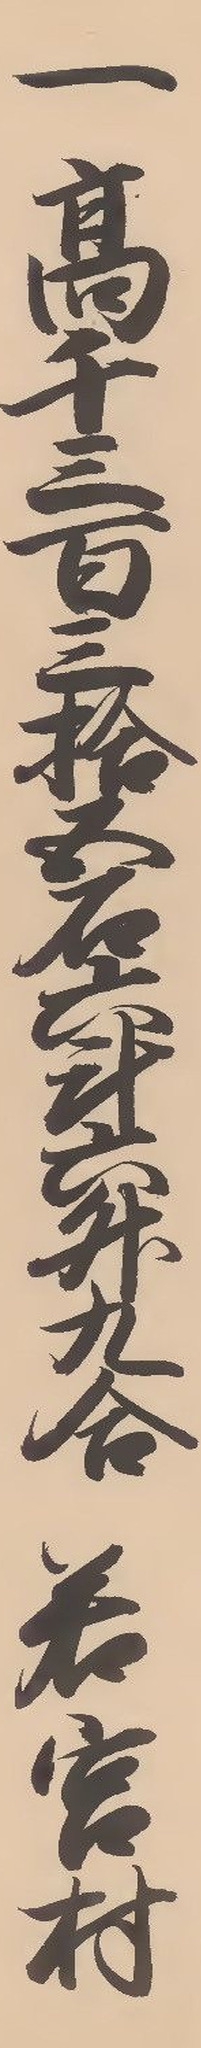一高千三百三拾五石六斗六升九合若宮村
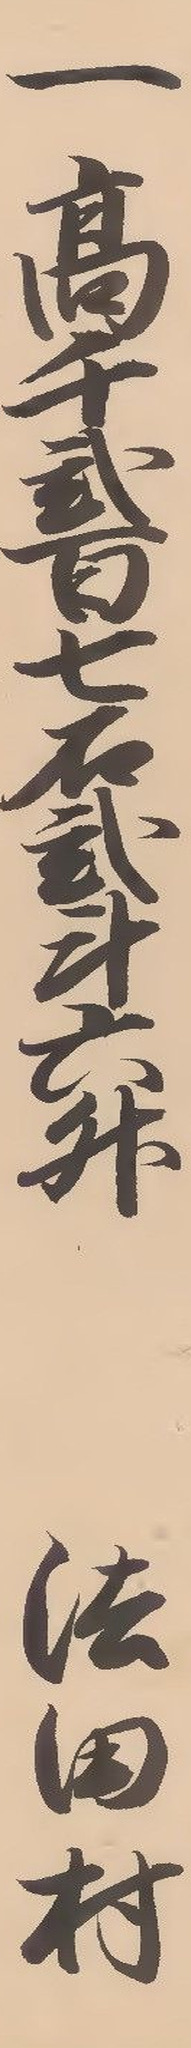一高千弐百七石弐斗六升法田村
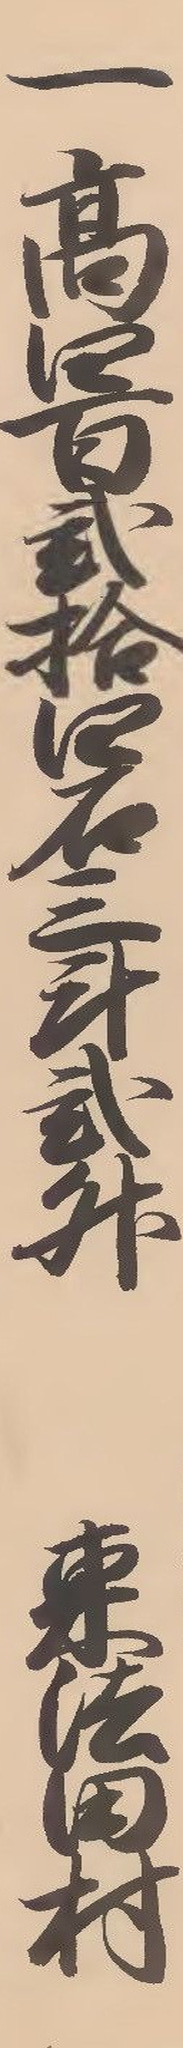一高四百弐拾四石三斗弐升東法田村
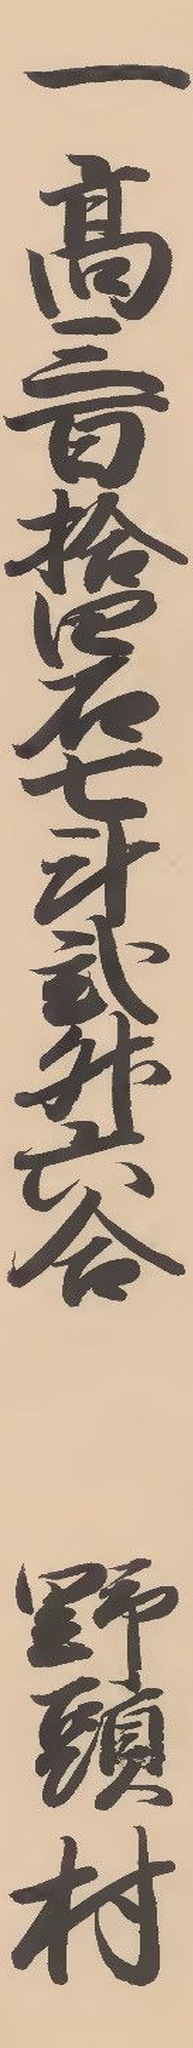一高三百拾四石七斗弐升六合野頭村
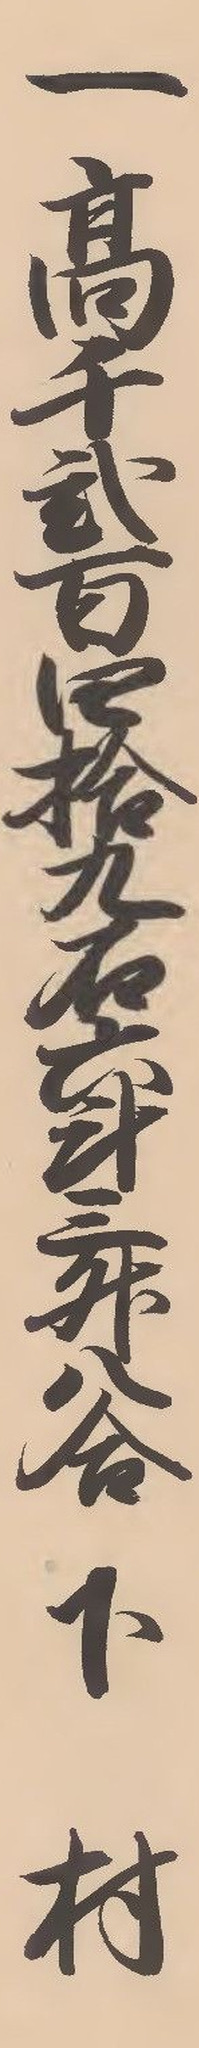一高千弐百四拾九石六斗三升八合下村
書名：出羽国郷帳　３
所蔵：国立公文書館 National Archives of Japan
